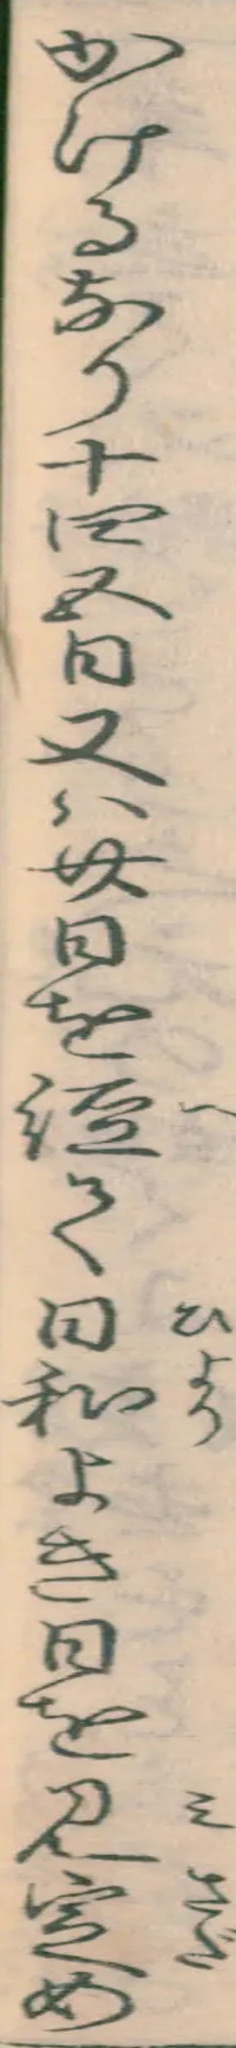かけるなり十四五日又は廿日を経て日和よき日を見定め
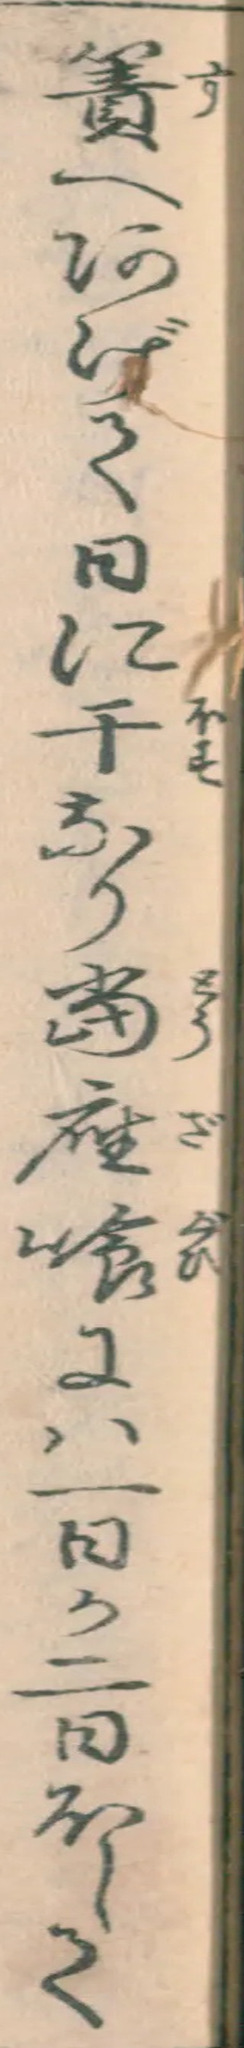簀へあげて日に干なり当座喰には一日か二日ほして
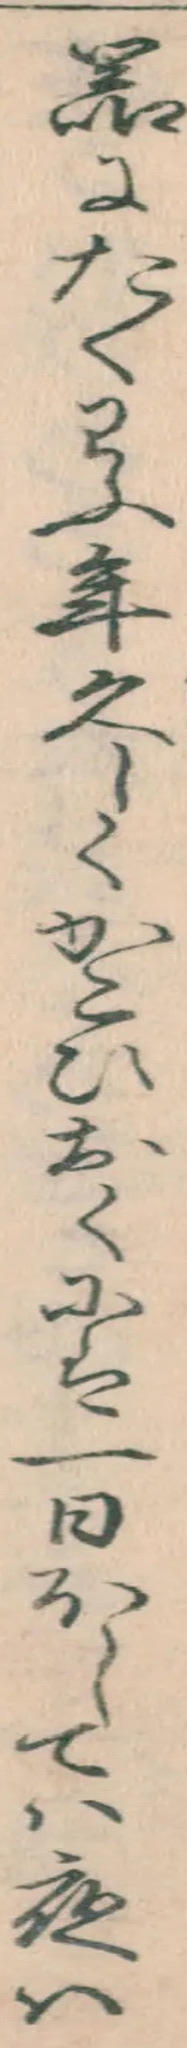器にたくわふ年久しくかこひおくには一日ほしては夜は
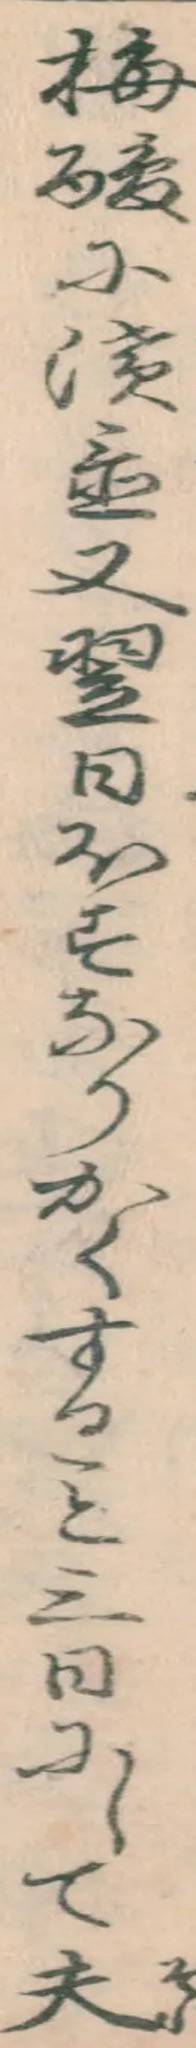梅酸に漬置又翌日ほすなりかくすること三日にして夫
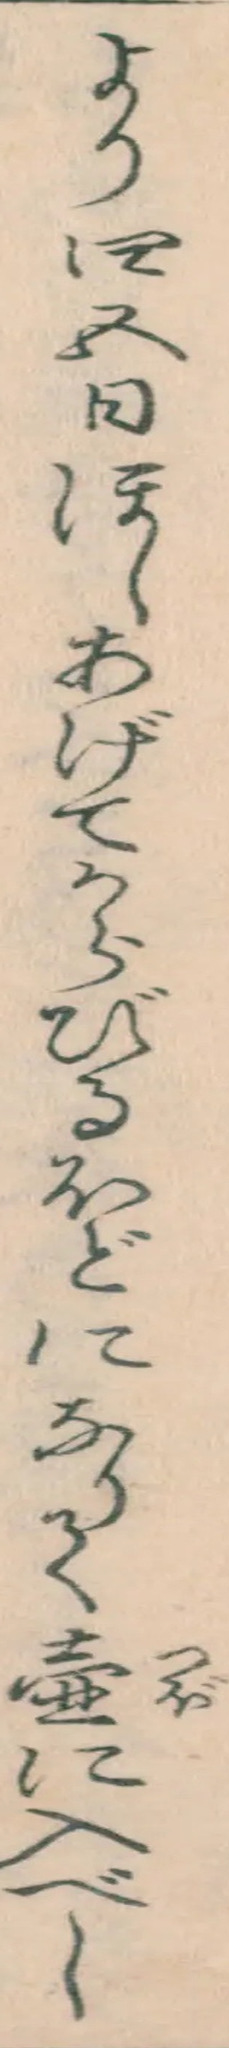より四五日ほしあげてからびるほどになりて壺に入べし
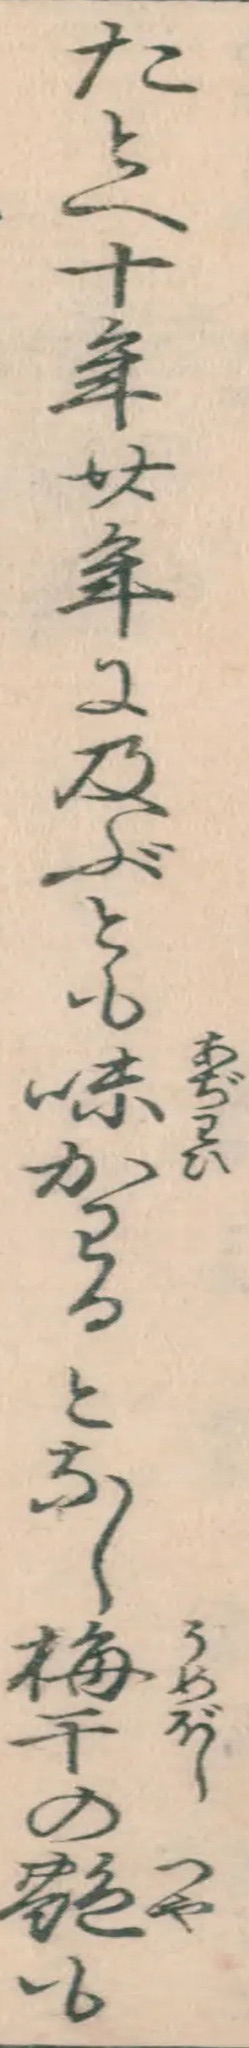たとへ十年廿年に及ぶとも味かわるとなし梅干の艶も
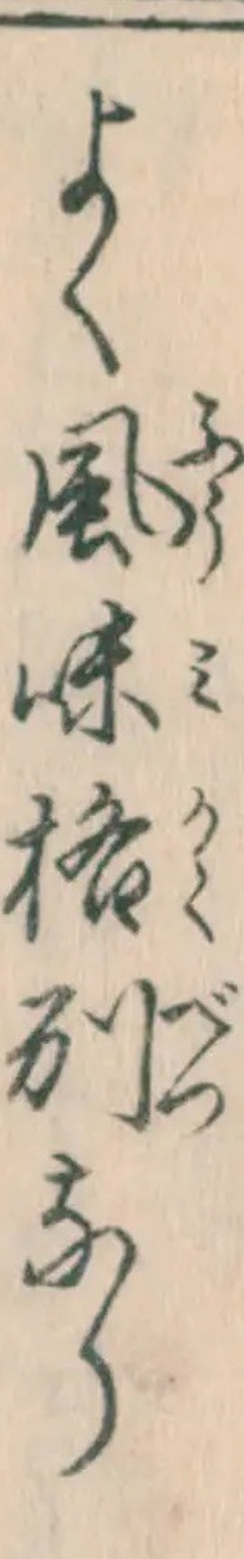よく風味格別なり
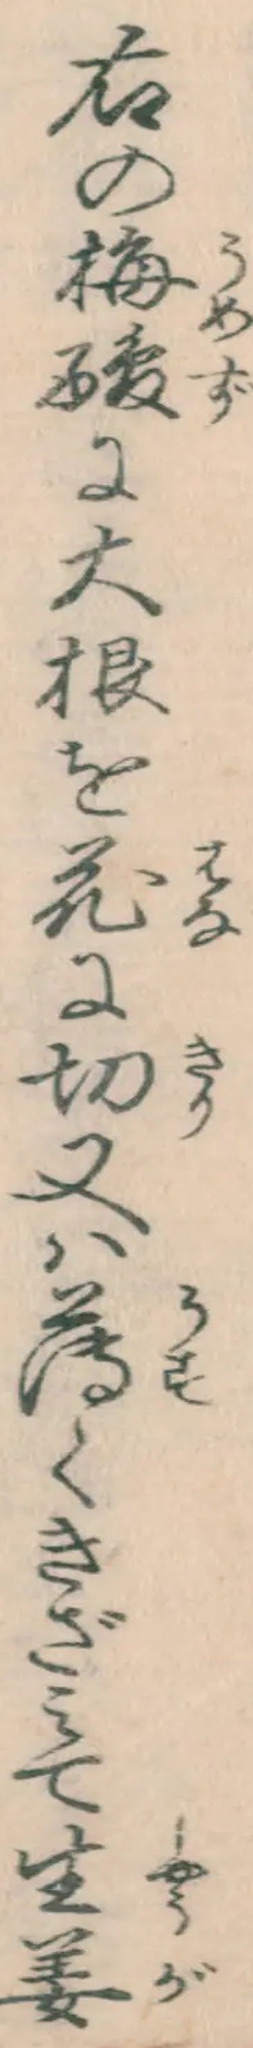右の梅酸に大根を花に切又は薄くきざみて生姜
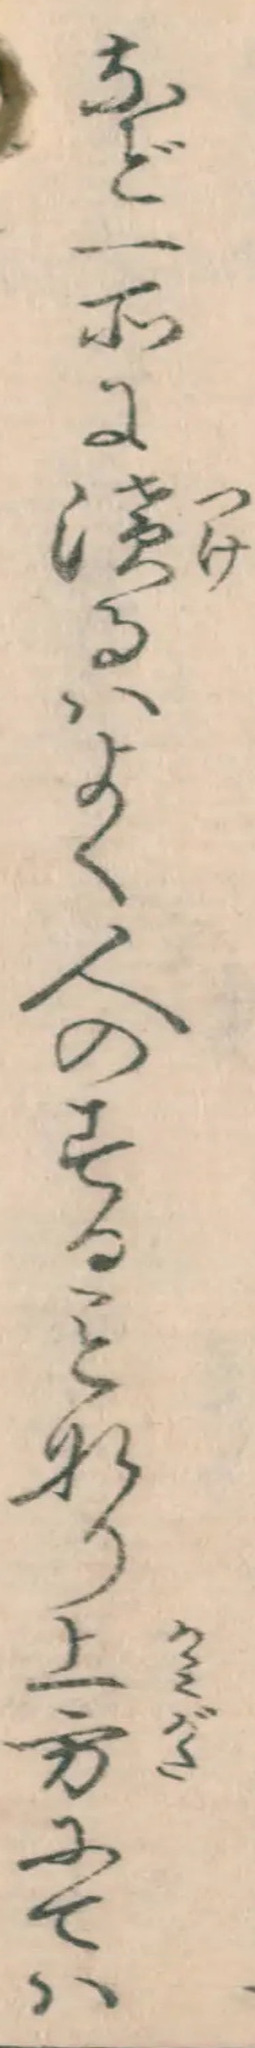など一所に漬るはよく人のすることなり上方にては
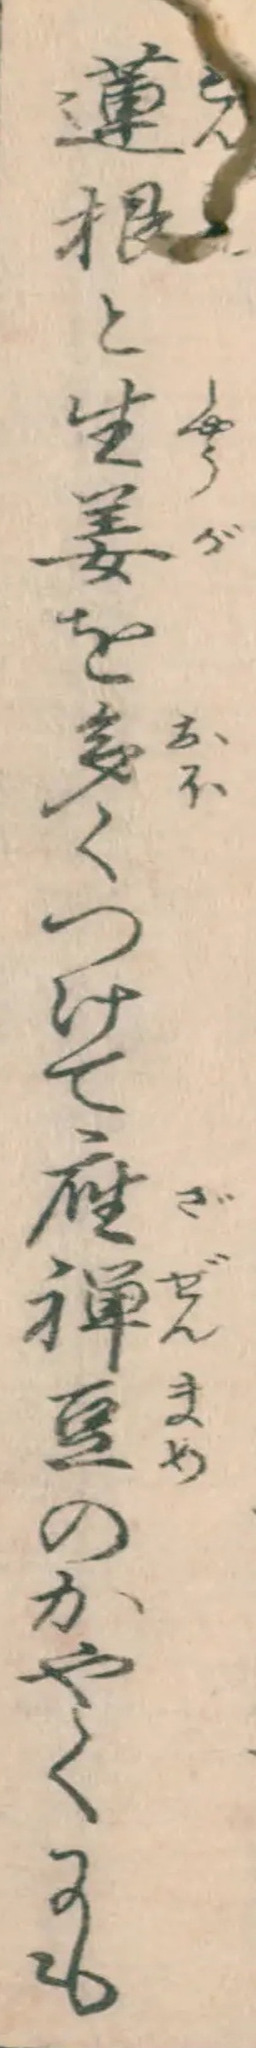蓮根と生姜を多くつけて座禅豆のかやくにも

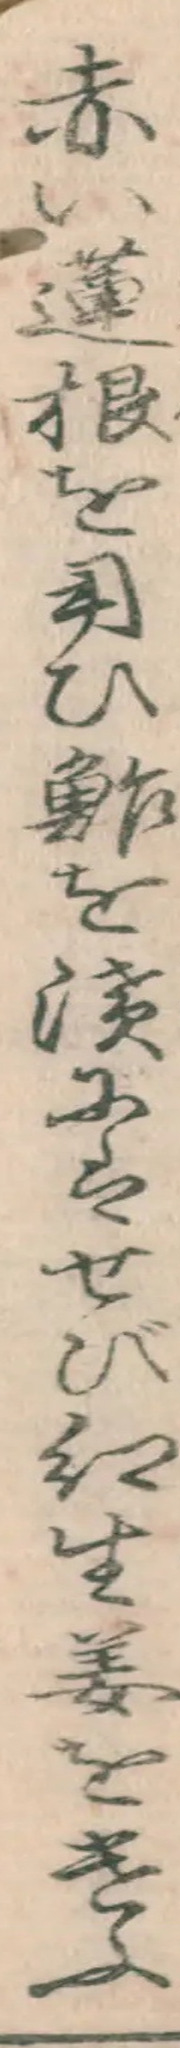赤い蓮根を用ひ鮓を漬にはせび紅生姜を遣ふ
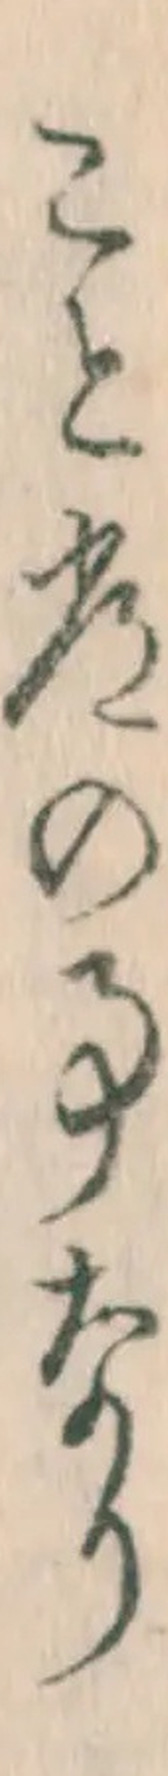こと常の事なり
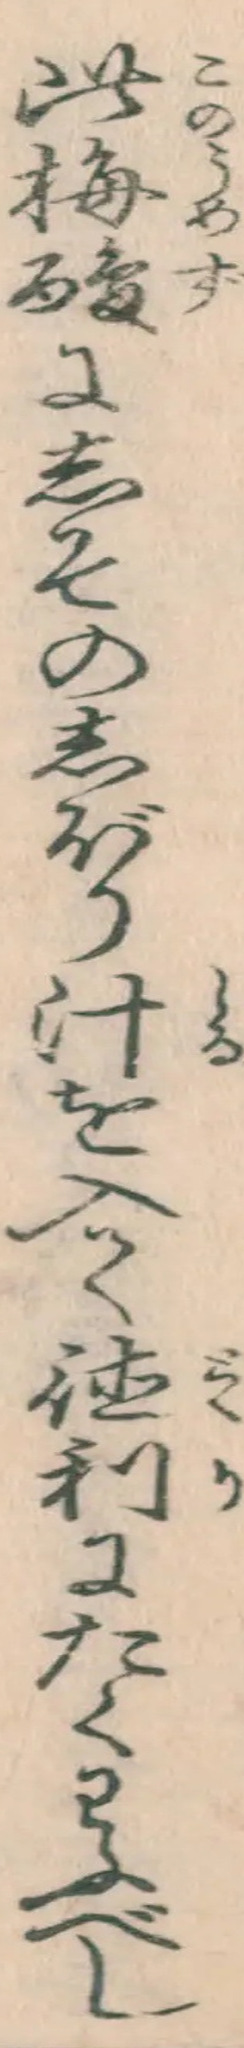此梅酸にしそのしぼり汁を入て徳利にたくわふべし
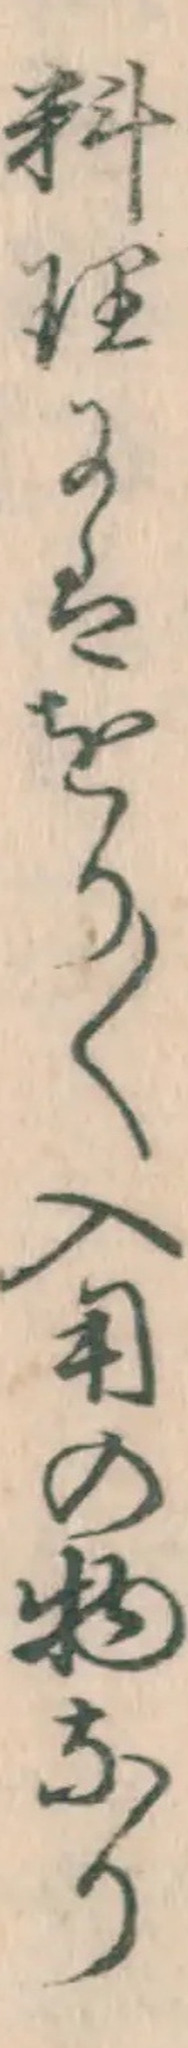料理にはをり〳〵入用の物なり
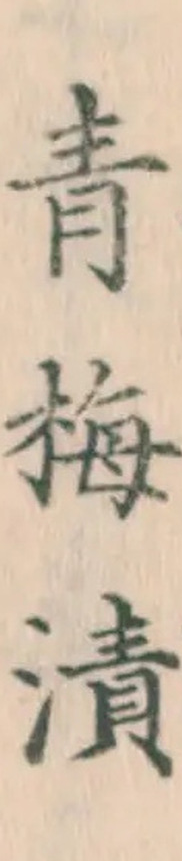青梅漬
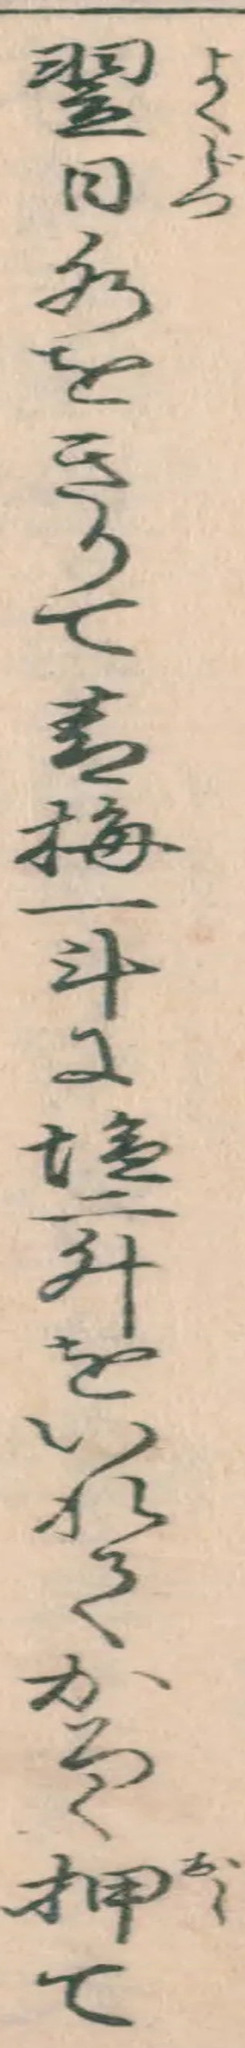翌日水をきりて青梅一斗に塩二升をいれてかろく押て
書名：四季漬物鹽嘉言
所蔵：国立国会図書館 National Diet Library, JAPAN
